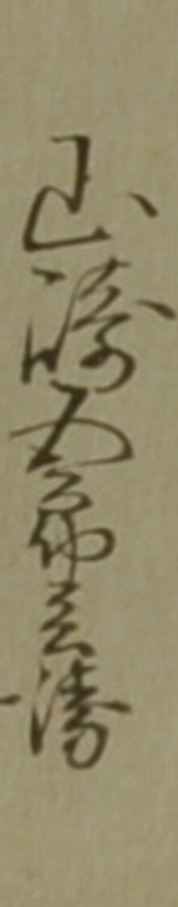山崎五郎兵衛
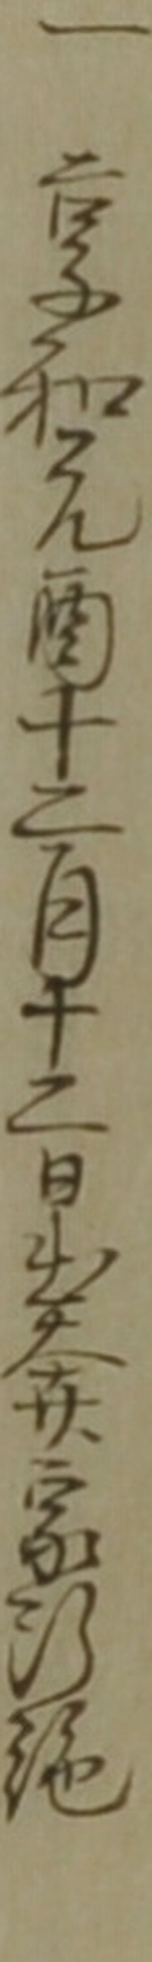一享和元酉十二月十二日出奔家断絶
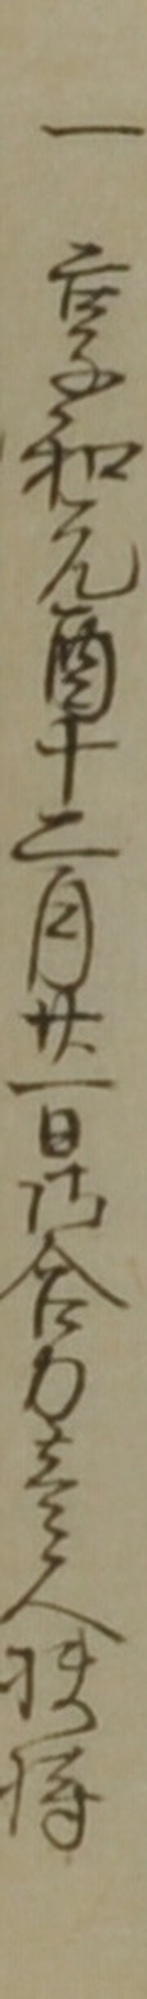一享和元酉十二月廿一日御合力壱人扶持
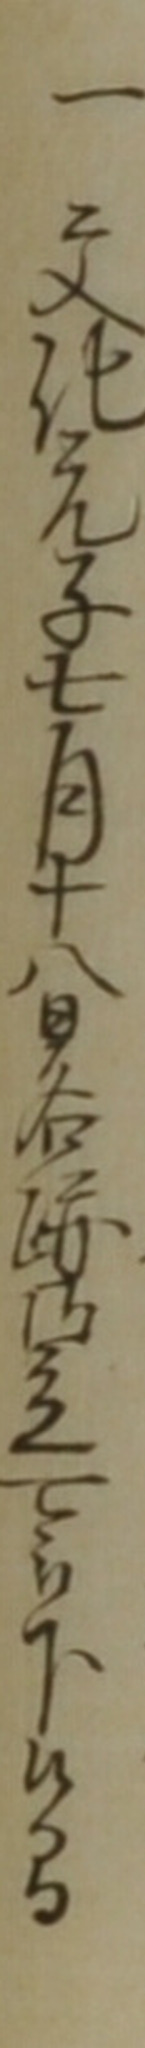一文化元子七月十八日名跡御立可被下候間
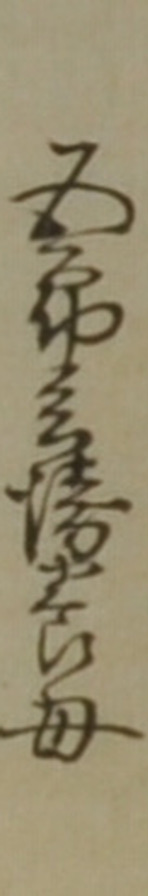五郎兵衛養母
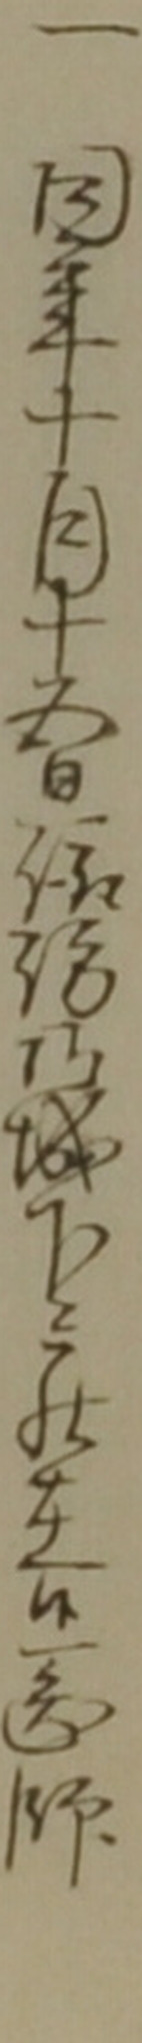一同年十月十五日諏訪御城下罷在候医師
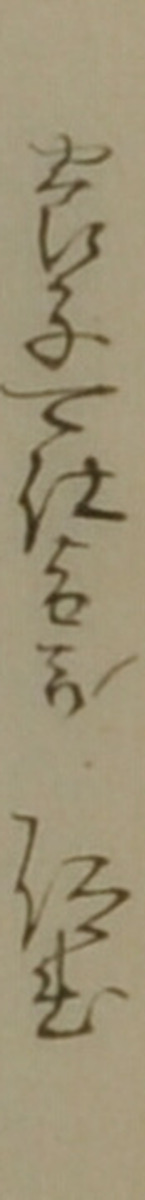養子可仕旨被仰出
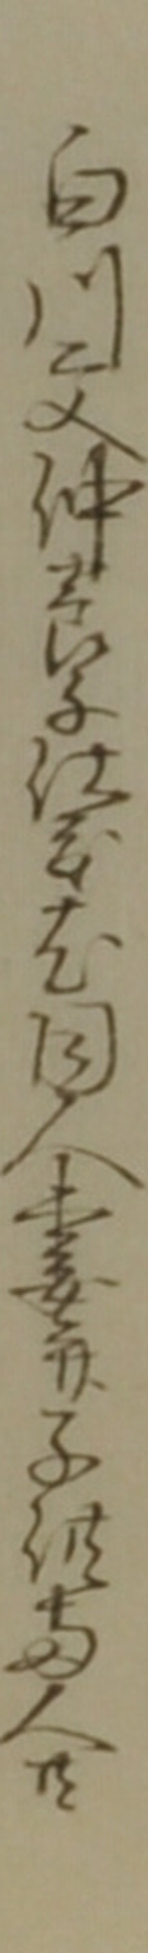白川文仲養子仕度尤同人妻并子供両人共
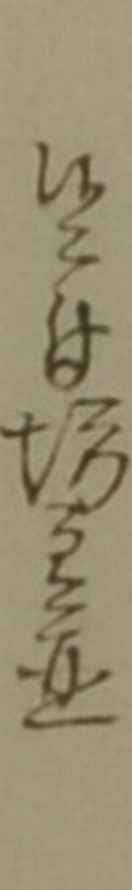候ニ付坊主並
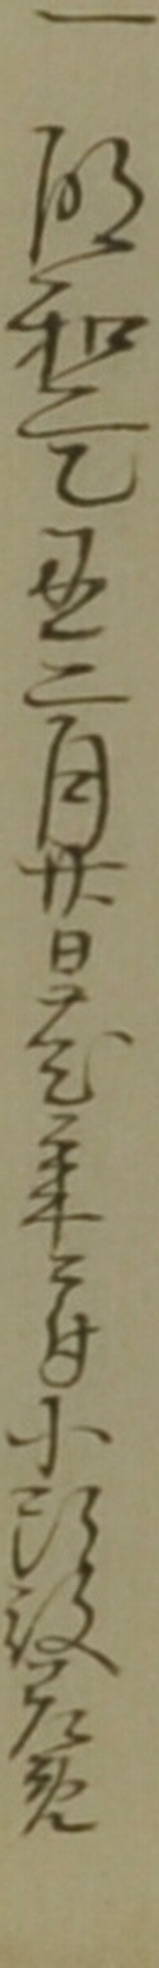一明和二乙丑二月廿日老年ニ付小頭役差免
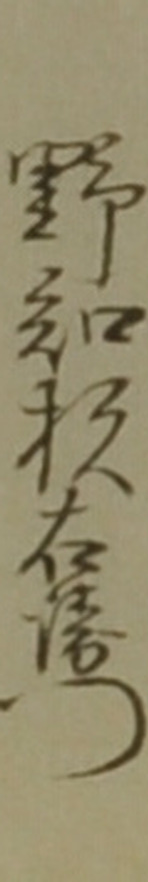野知杉右衛門
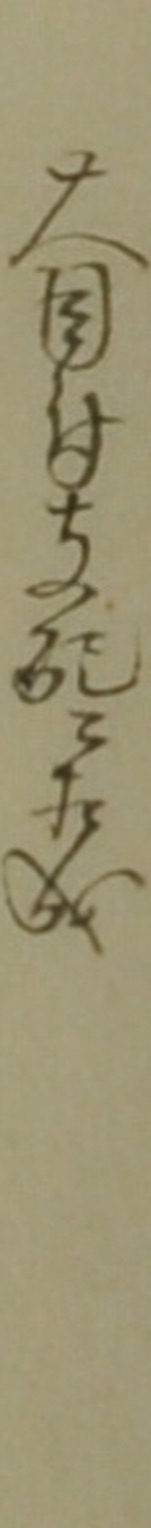大目付支配相成
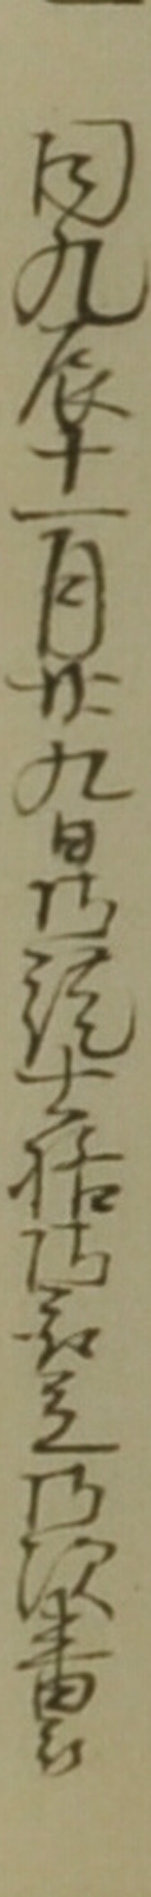一同九辰十一月廿九日御徒士格御取立御次番被
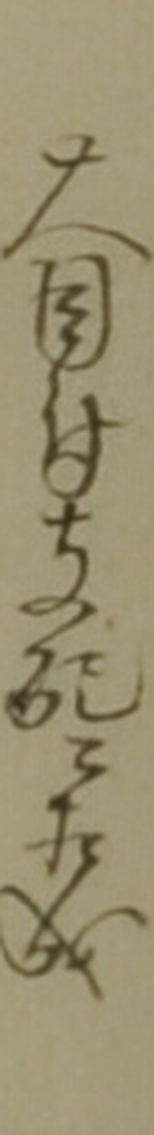大目付支配相成
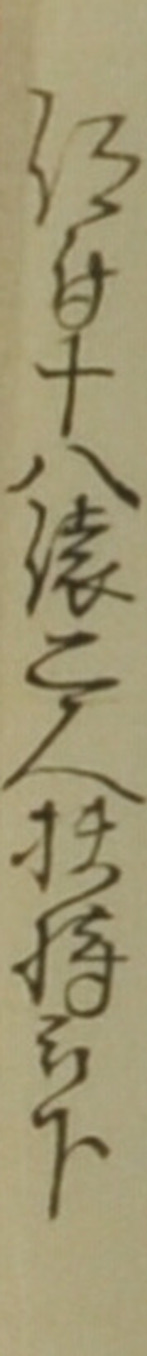仰付十八俵二人扶持被下

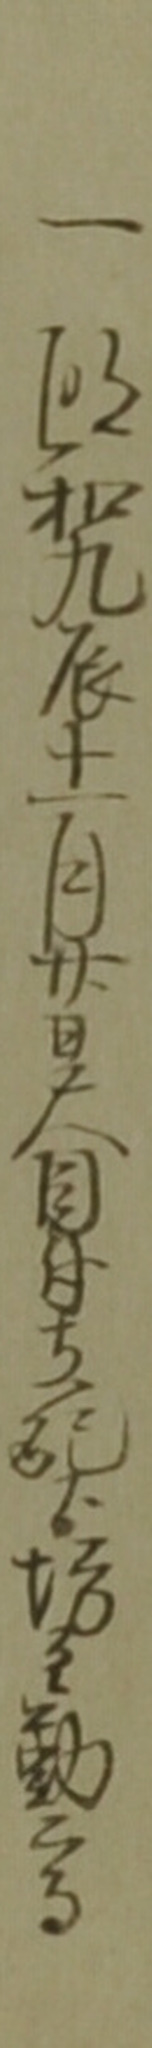一明和九辰十一月廿日大目付支配ゟ坊主勤高
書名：無足廃家（壱）
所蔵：伊那市立高遠町図書館・合同会社AMANE
